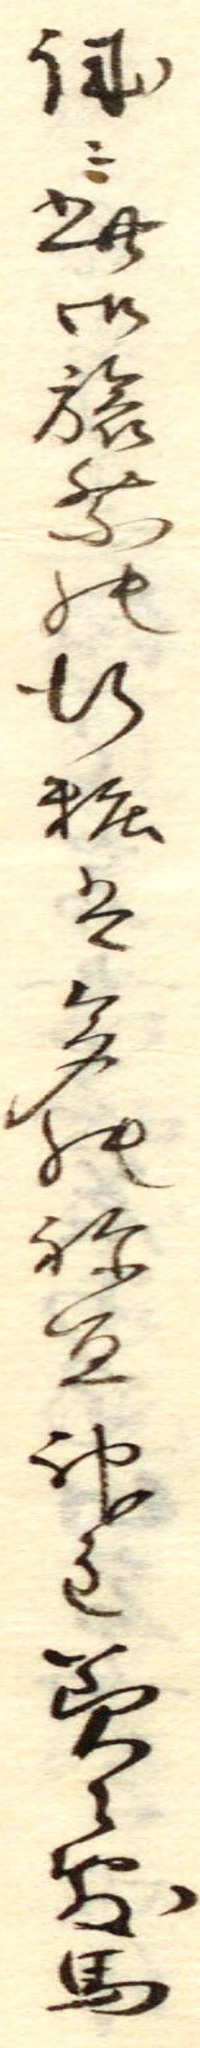誠に此御旅祭の行粧は多の祢宜神主美々敷馬
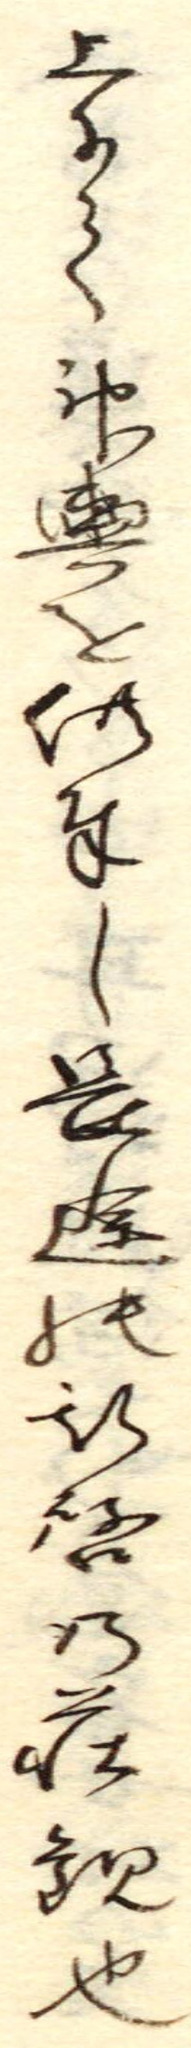上にて神輿を供奉し長途の行啓の壮観也
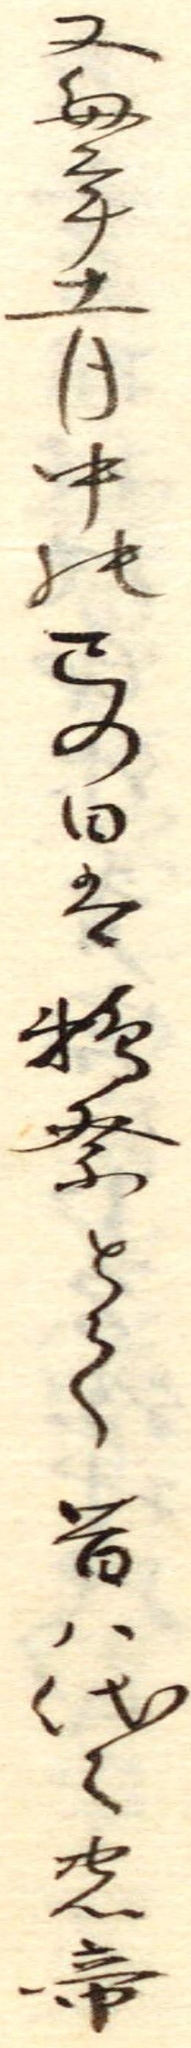又毎年十一月中の巳の日は鵜祭とて昔は代々の帝
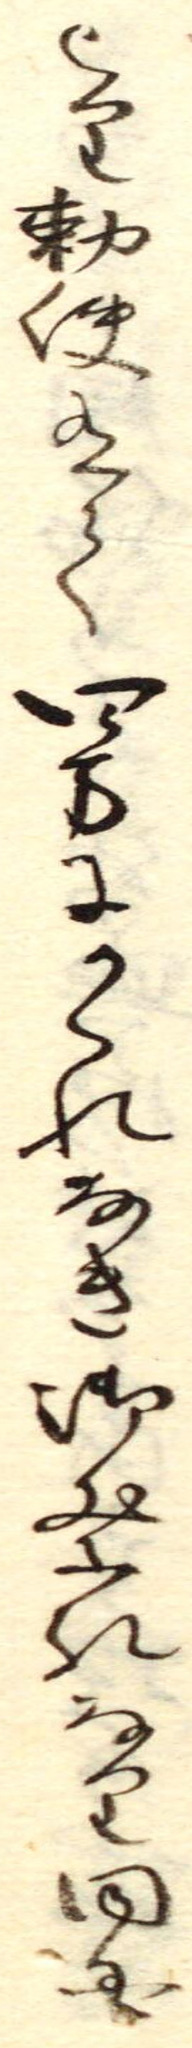より勅使有て四方にかくれなき御祭礼なり同国
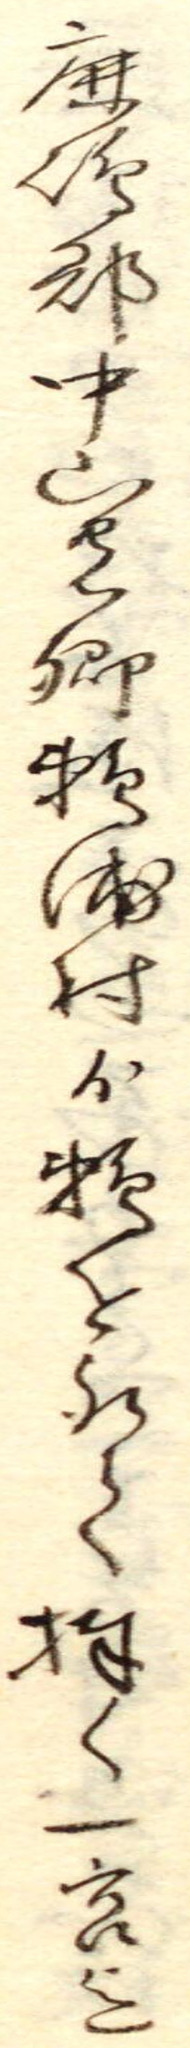鹿嶋郡中山の郷鵜浦村ゟ鵜を取て捧く一宮迄
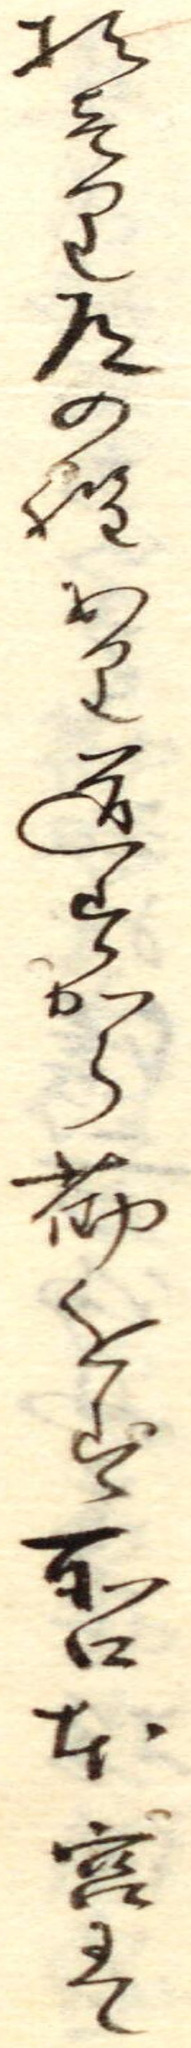拾壱里道の程あり道すから勧進す所口本宮にて
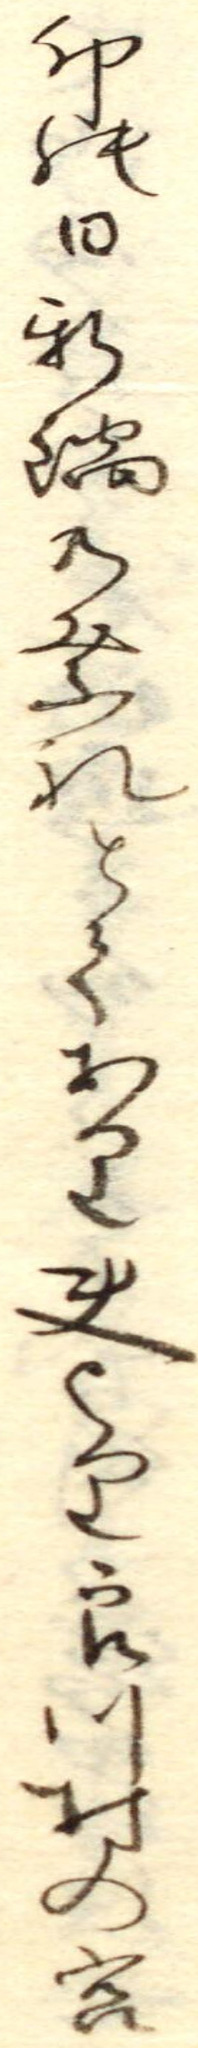卯の日新鍋の祭礼とてあり夫より良川村の宮
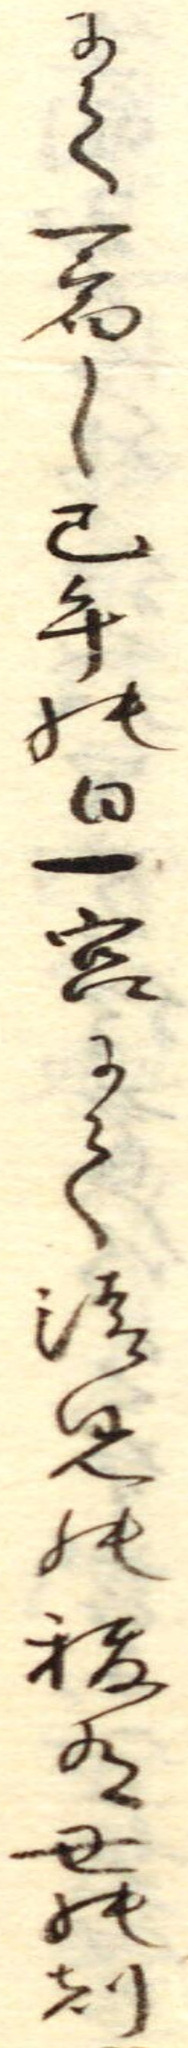にて一宿し巳年の日一宮にて清見の祓有丑の刻
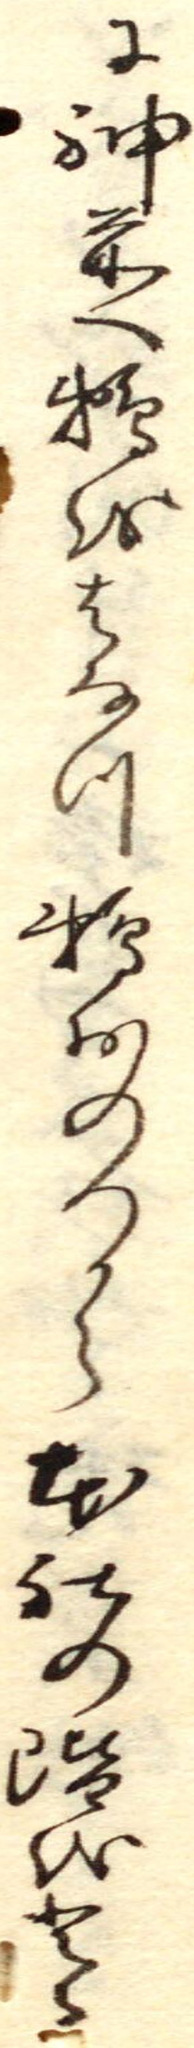に神前へ鵜をはなつ鵜おのつから本社の階を登る
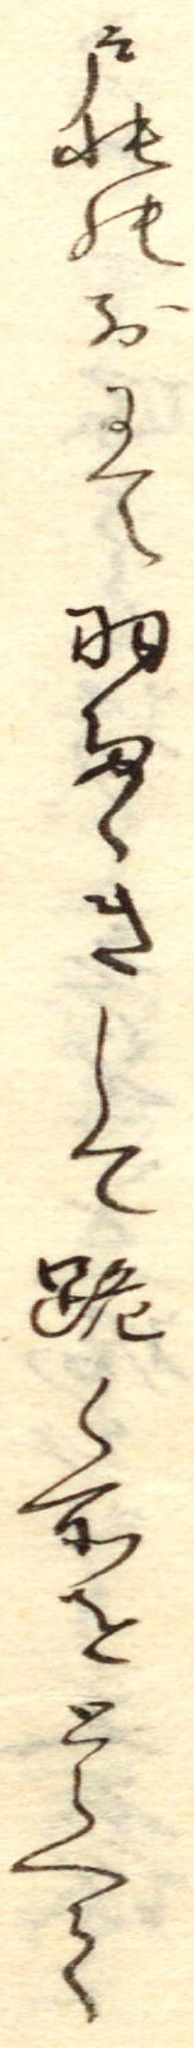戸帳の前にて羽たゝきして跪し所をとらへて
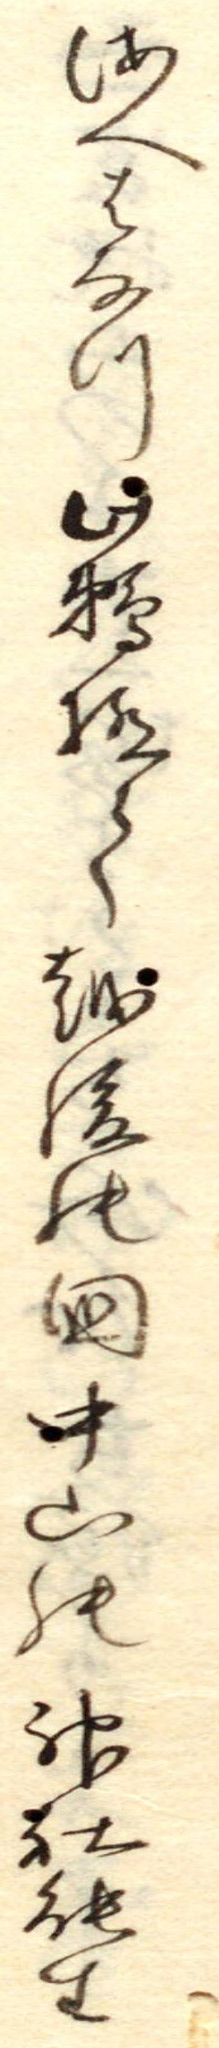海へはなつ此鵜極て越後の国中山の神社能生
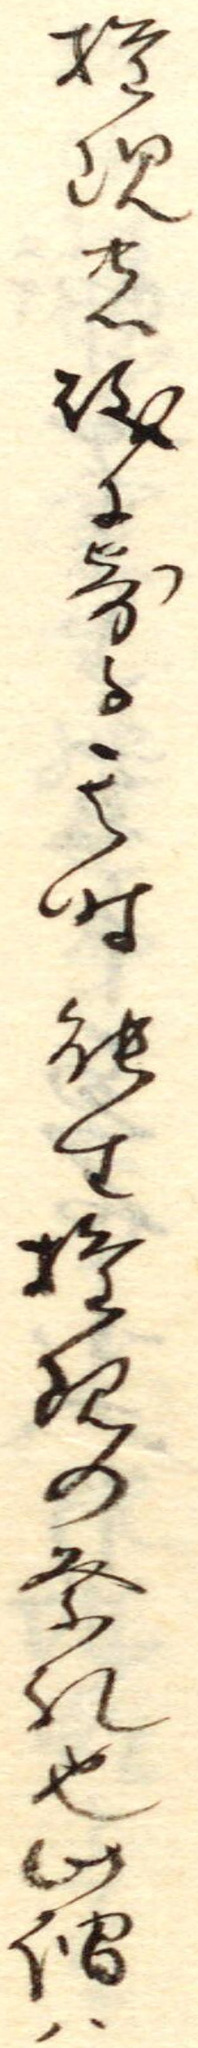権現の礒に寄る其時能生権現の祭礼也此謂は
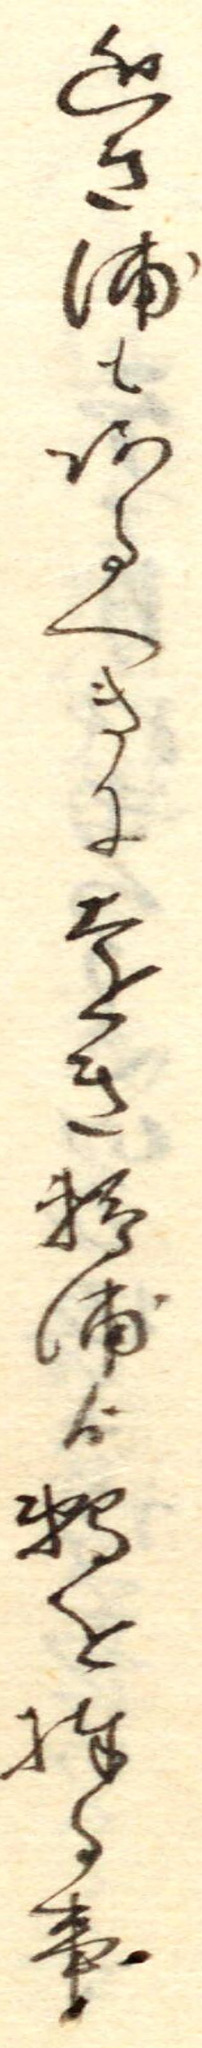近き浦もあるへきに遠き鵜浦ゟ鵜を捧る事
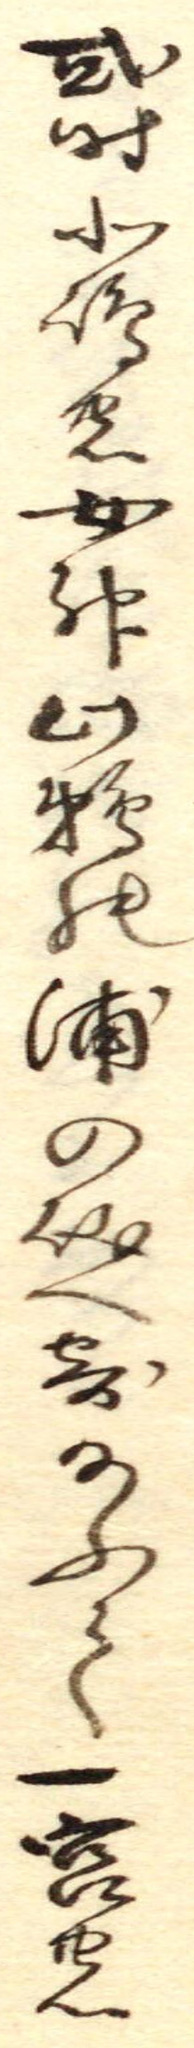或時北嶋の女神此鵜の浦の礒へ寄給ふて一宮の
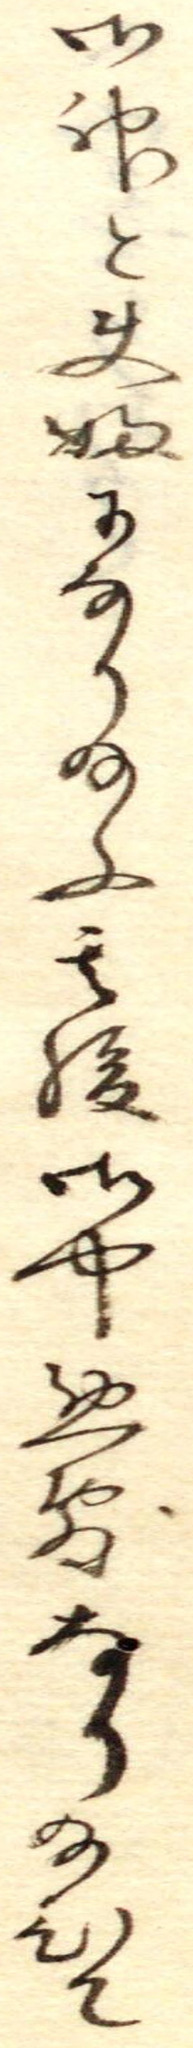御神と夫婦になり給ふ其後御中悪敷なり給ひて
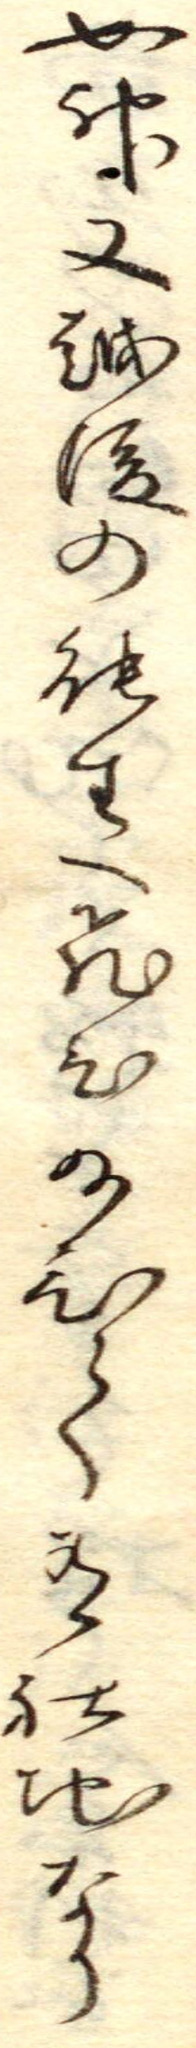女神又越後の能生へ飛ひ給ひて有社地なり
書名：能登名跡誌
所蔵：Ishikawa Prefectural Library
